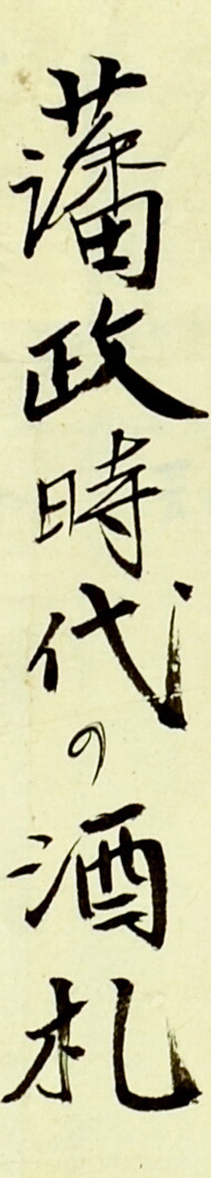藩政時代の酒札
